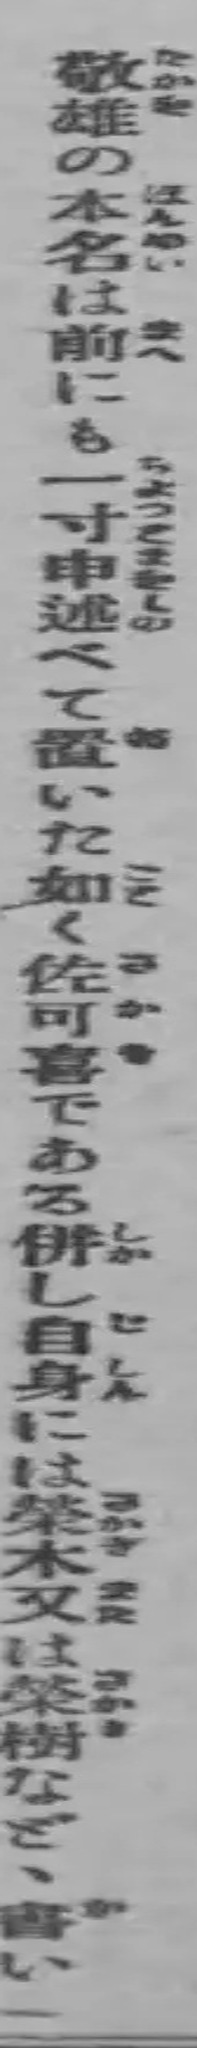敬雄の本名は前にも一寸申述べて置いた如く佐可喜である併し自身には栄木又は栄樹などゝ書い
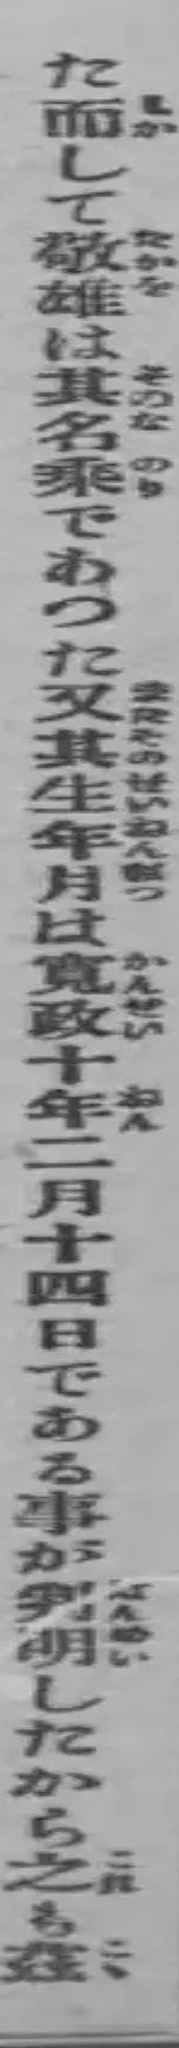た而して敬雄は其名乗であつた又其生年月は寛政十年二月十四日である事が判明したから之も茲
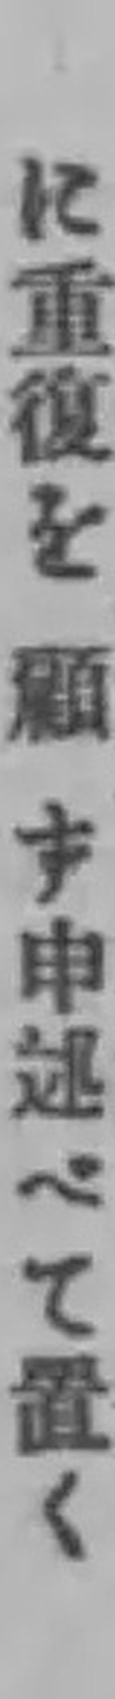に重複を顧ず申述べて置く
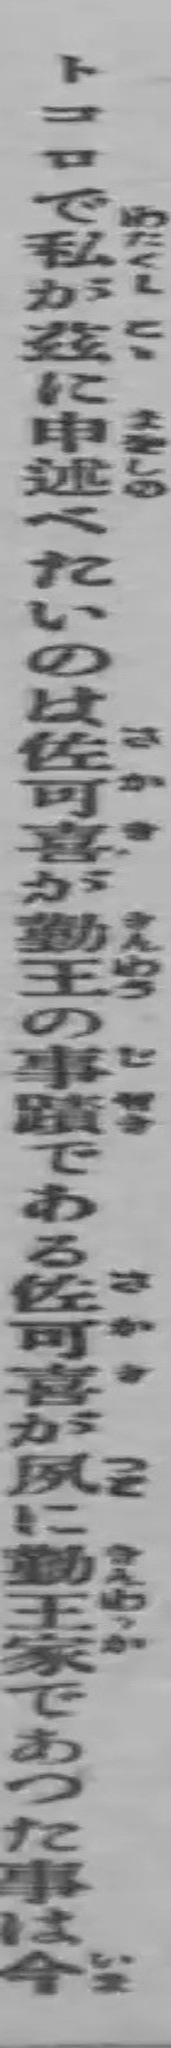トコロで私が茲に申述べたいのは佐可喜が勤王の事蹟である佐可喜が夙に勤王家であつた事は今
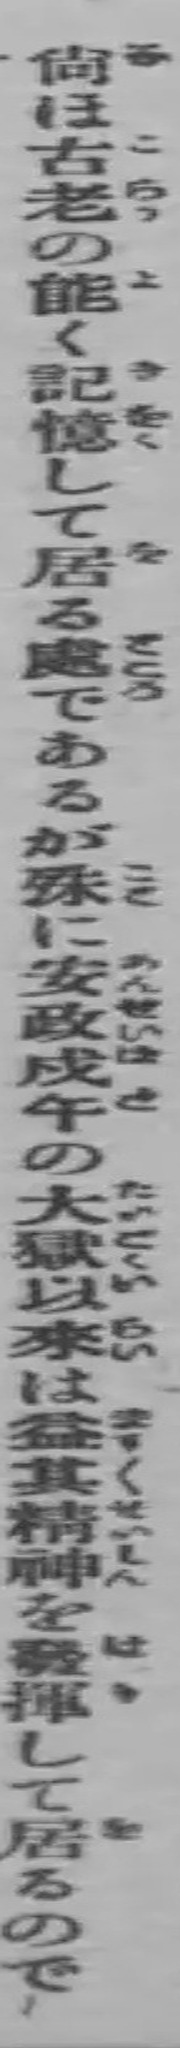尚ほ古老の能く記憶して居る処であるが殊に安政戌午の大獄以来は益其精神を発揮して居るので
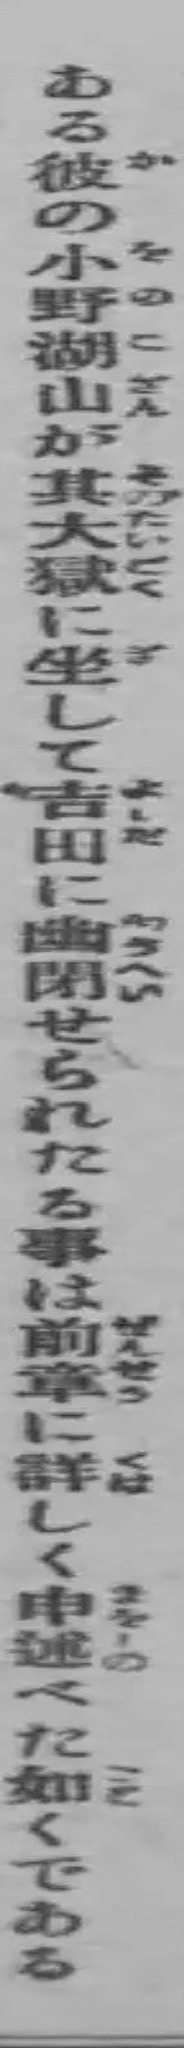ある彼の小野湖山が其大獄に坐して吉田に幽閉せられたる事は前章に詳しく申述べた如くである
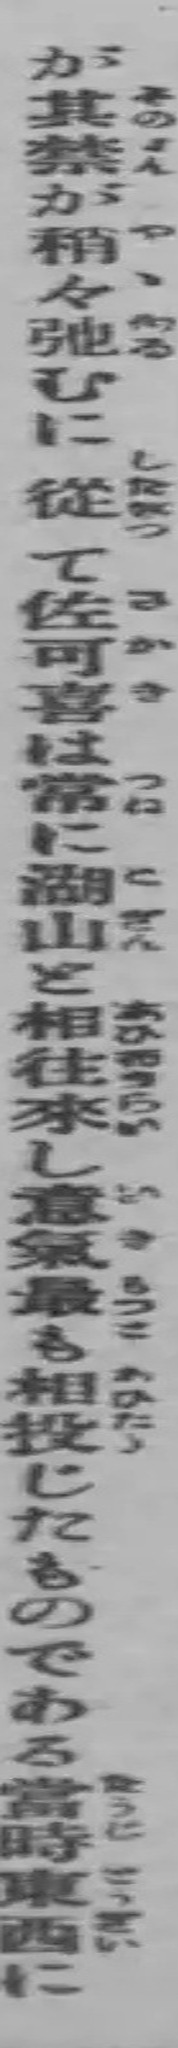が其禁が稍々弛むに従て佐可喜は常に湖山と相往来し意気最も相投じたものである当時東西に
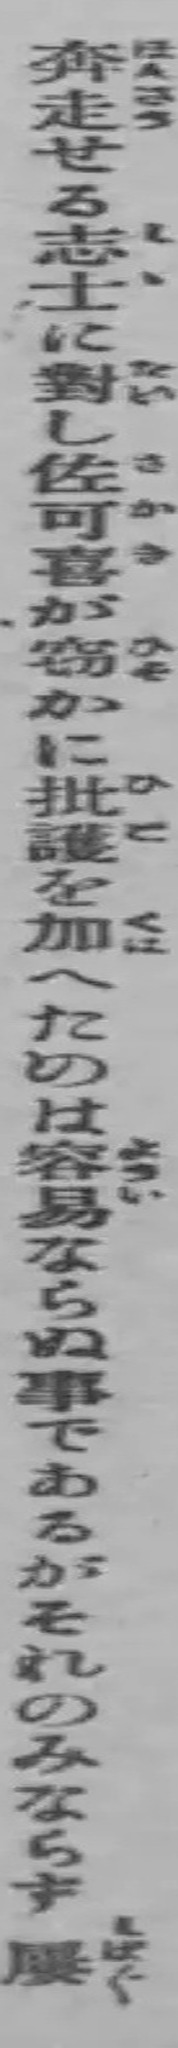奔走せる志士に対し佐可喜が窃かに批護を加へたのは容易ならぬ事であるがそれのみならず屡
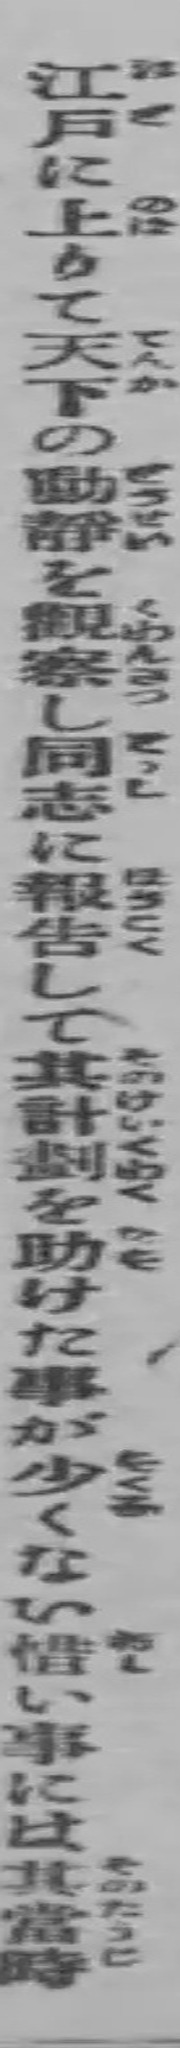江戸に上りて天下の動静を観察し同志に報告して其計画を助けた事が少くない惜い事には其当時
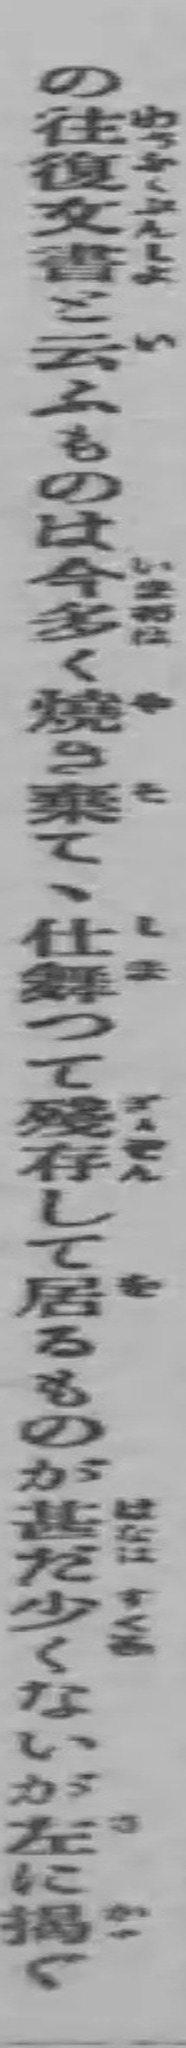の往復文書と云ふものは今多く焼き棄てゝ仕舞つて残存して居るものが甚だ少くないが左に掲ぐ
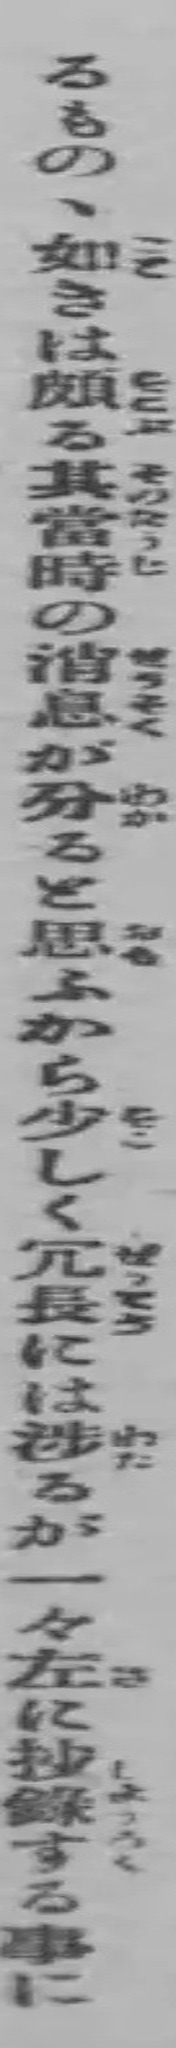るものゝ如きは頗る其当時の消息が分ると思ふから少しく冗長には渉るが一々左に抄録する事に
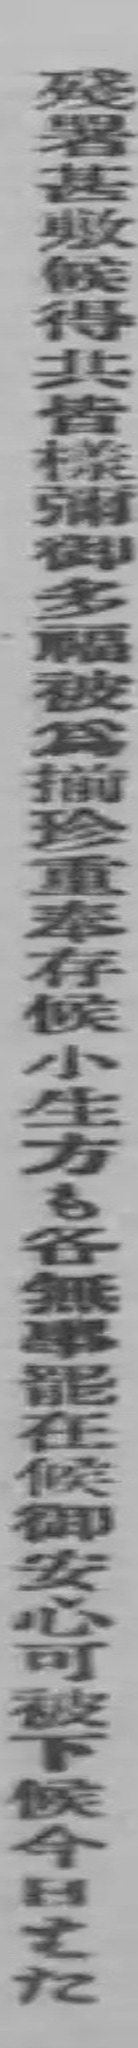残暑甚敷候得共皆様弥御多福被為揃珍重奉存候小生方も各無事罷在候御安心可被下候今日はた
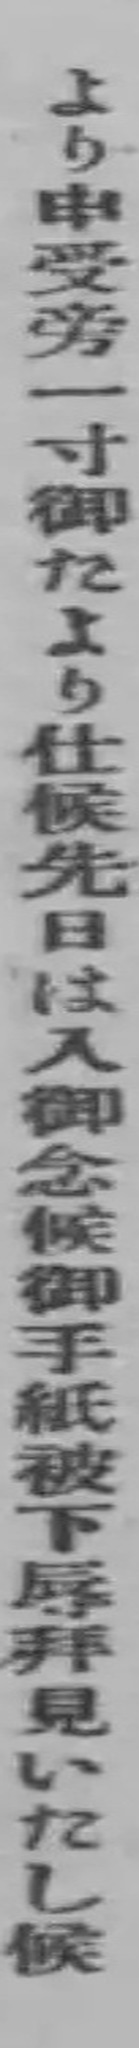より申受旁一寸御たより仕候先日は入御念候御手紙被下辱拝見いたし候
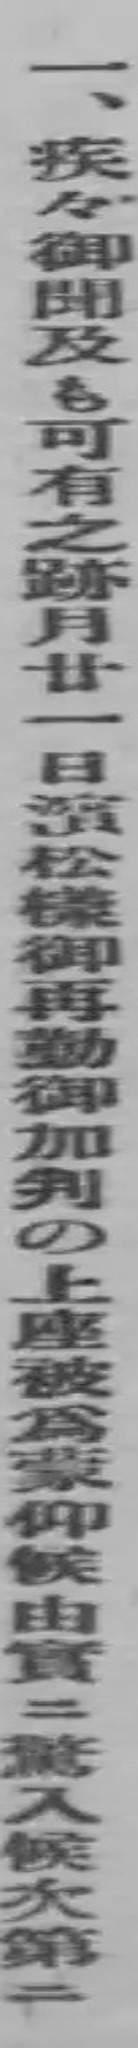一、疾々御聞及も可有之跡月廿一日浜松様御再勤御加判の上座被為蒙仰候由実ニ驚入候次第ニ
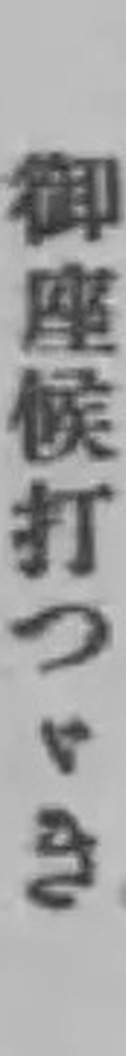御座候打つゞき

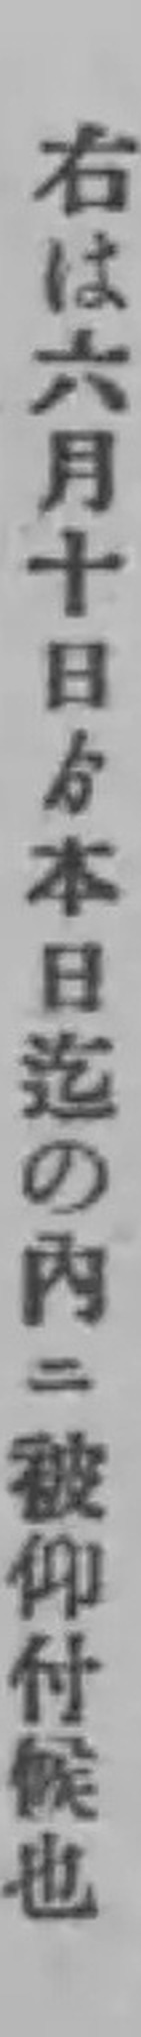右は六月十日ゟ本日迄の内ニ被仰付候也
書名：豊橋市史談
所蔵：国立国会図書館 National Diet Library, JAPAN
